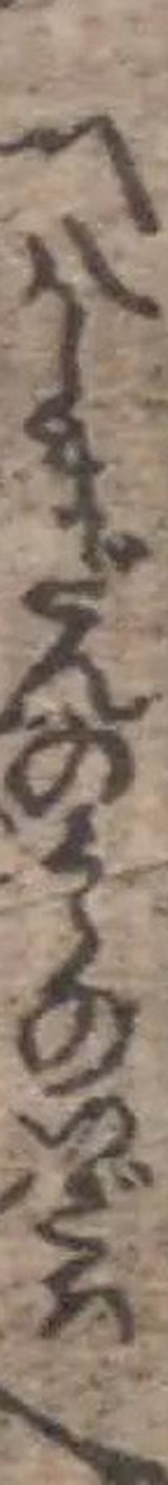「八しまだんのうらのつぎハ
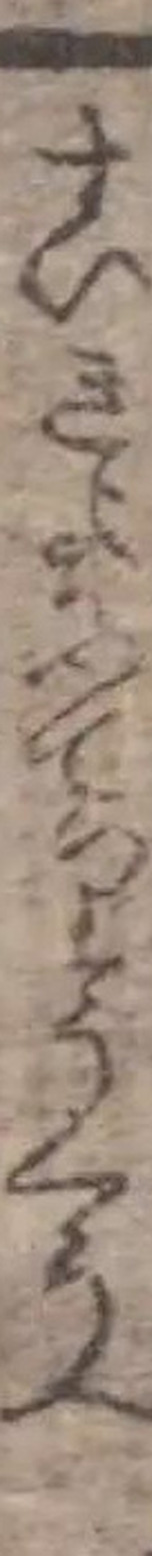すいきよにてりうくうへ
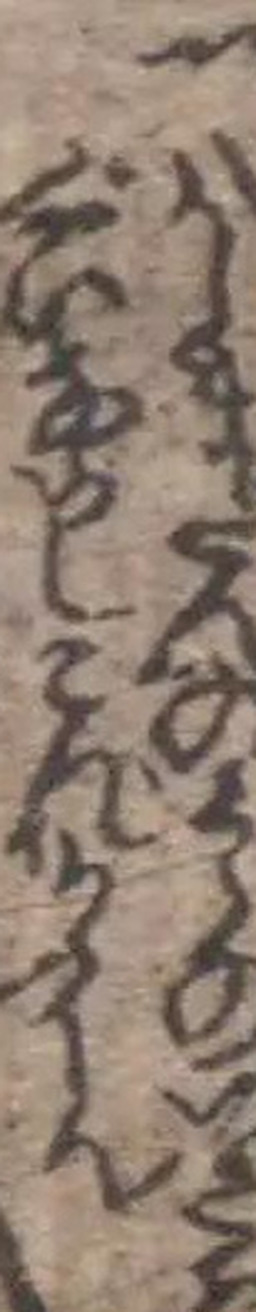ぐいながしこれからしん
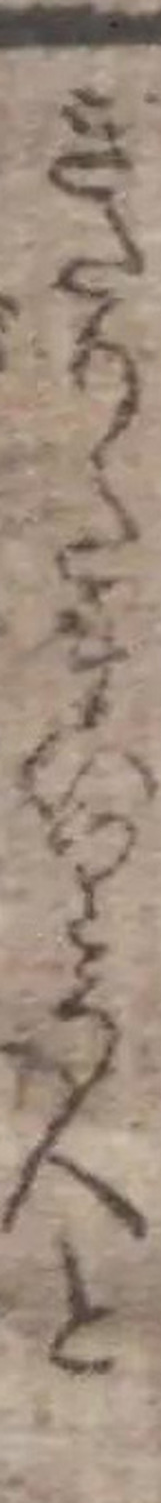きたりたまいりう人と
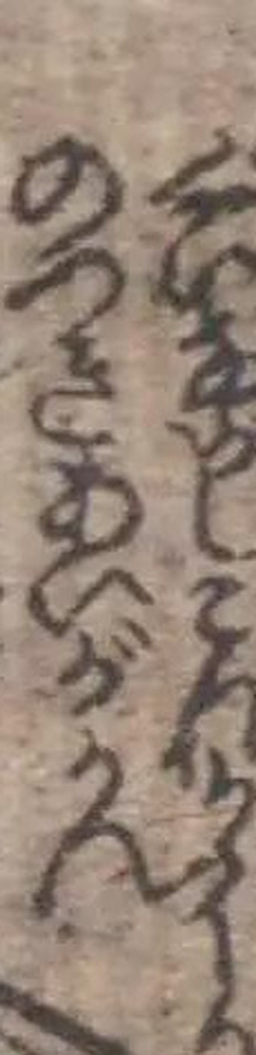つきあいがかん
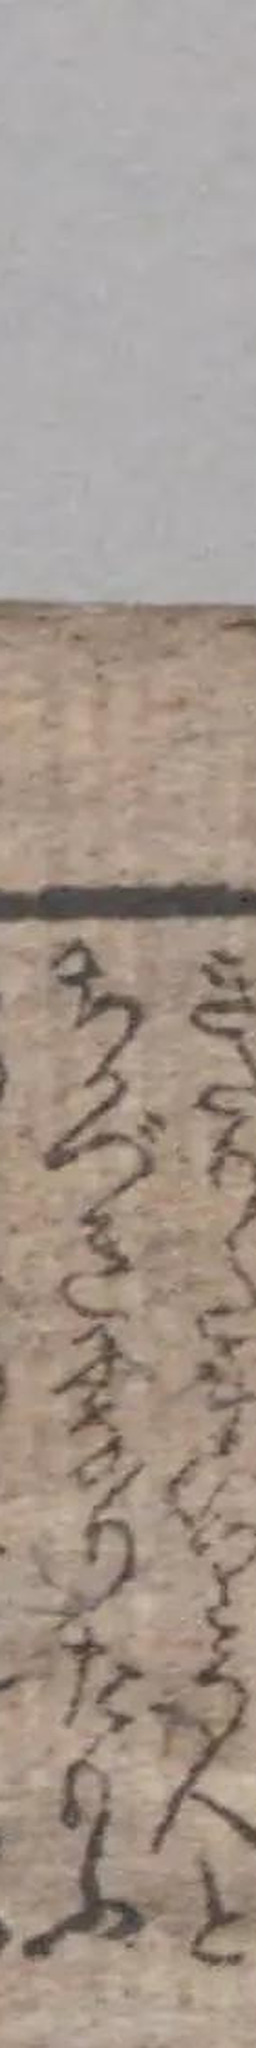ちかづきになりたもふ
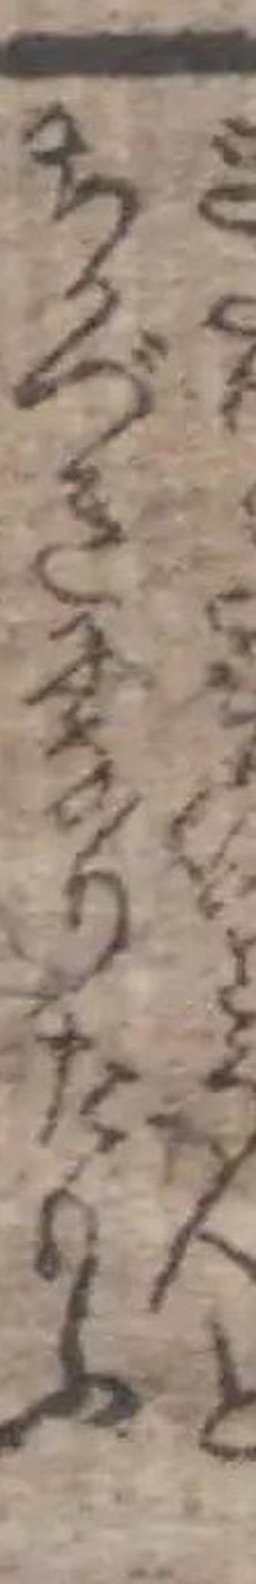ちかづきになりたもふ
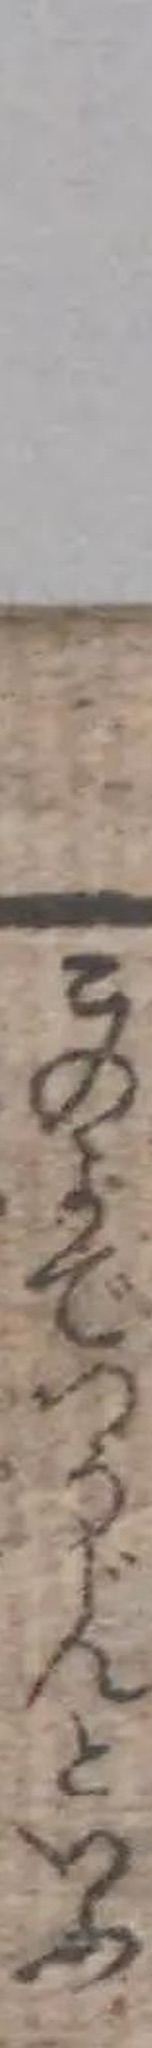このよでつうじんといふ
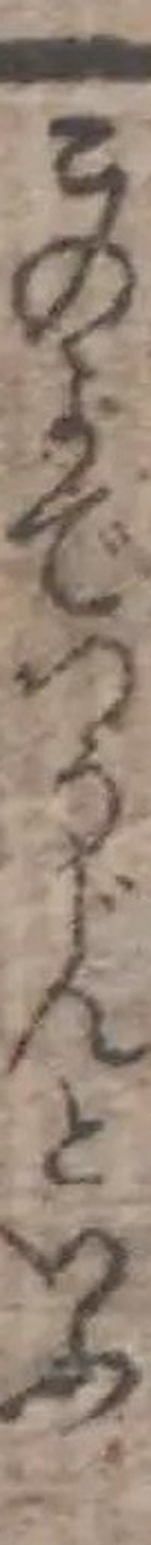このよでつうじんといふ
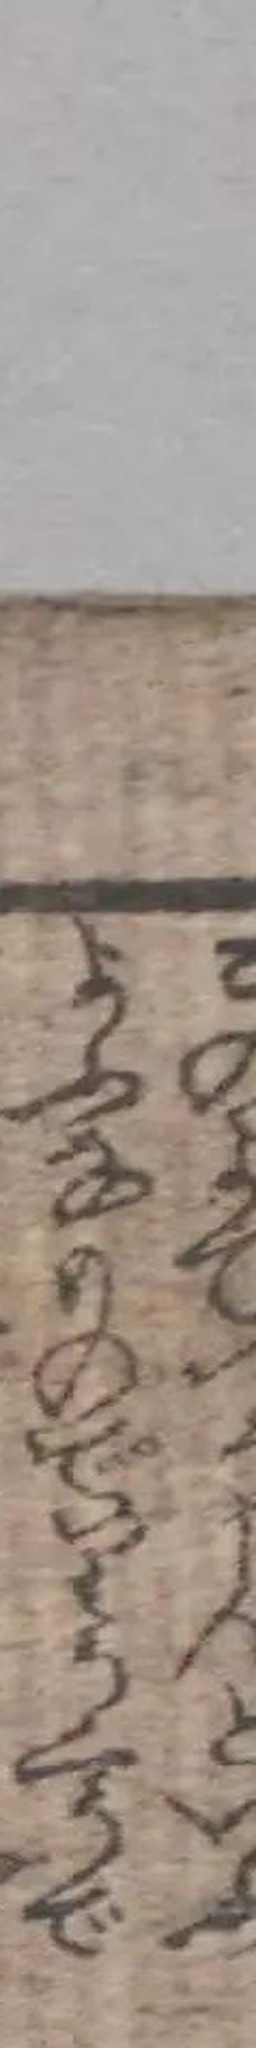よふなものでりうくうで
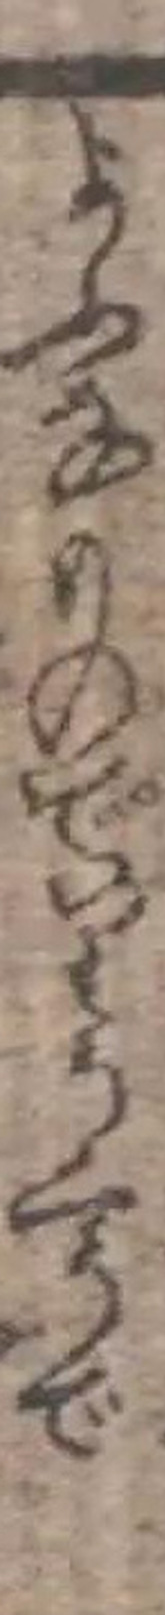よふなものでりうくうで
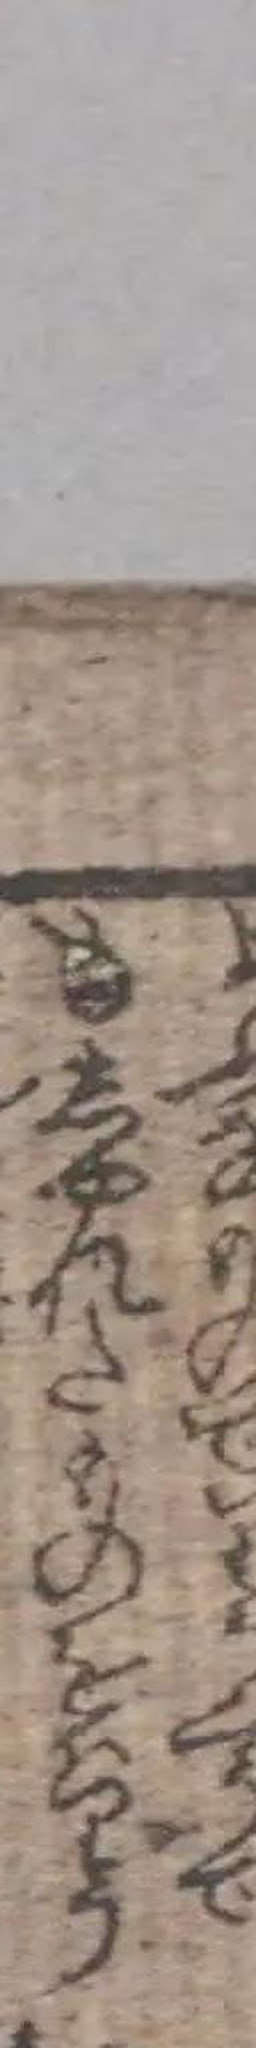もしやれたものをハりう
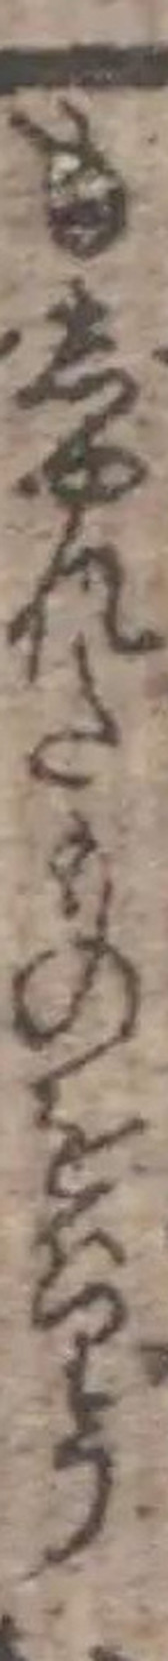もしやれたものをハりう
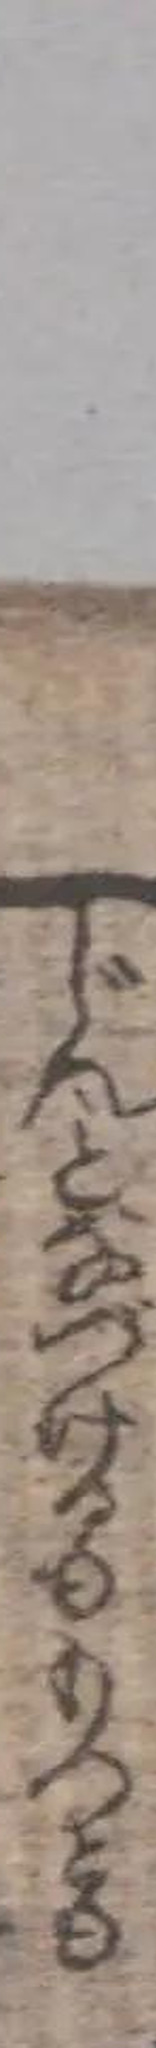じんとなづけるももつとも
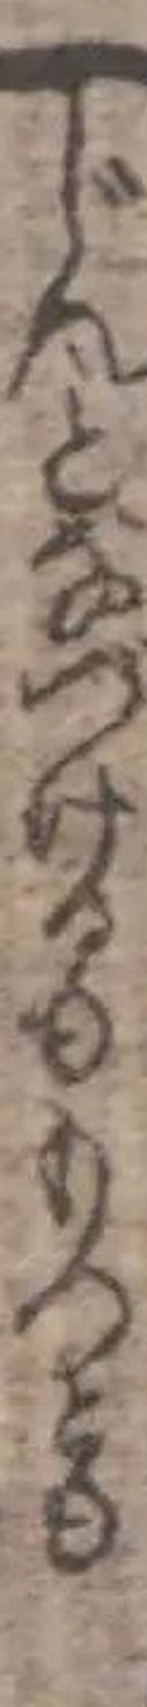じんとなづけるももつとも
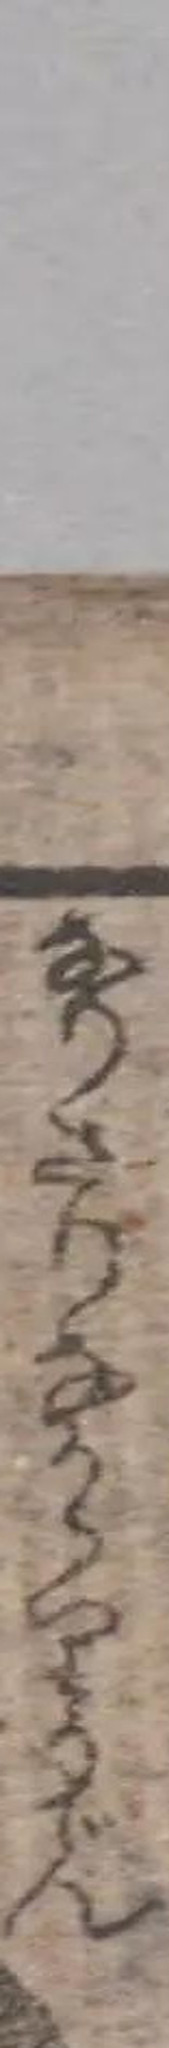なりさりなからりうじん
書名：草紙の曙 3巻
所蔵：国立国会図書館 National Diet Library, JAPAN
